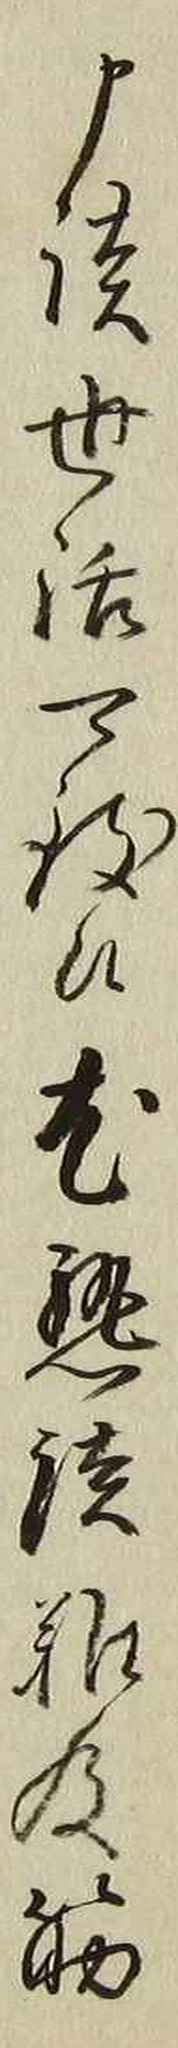申談世話可致候尤熟談難及筋
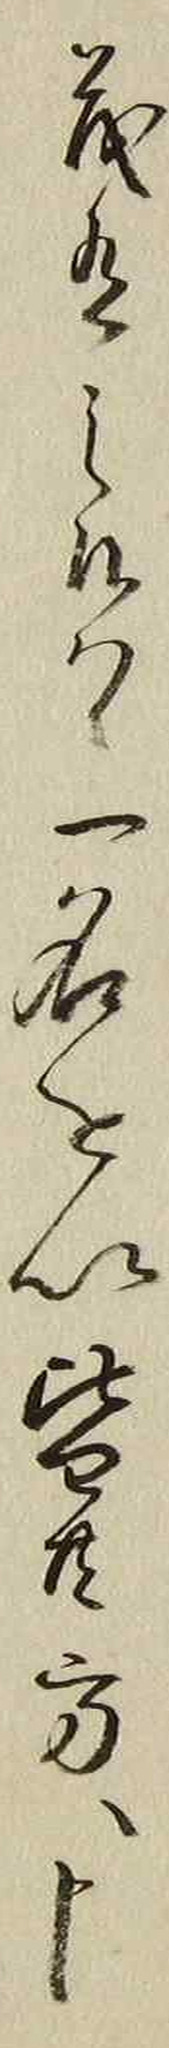茂有之候ハヽ一名を以皆共方へ申
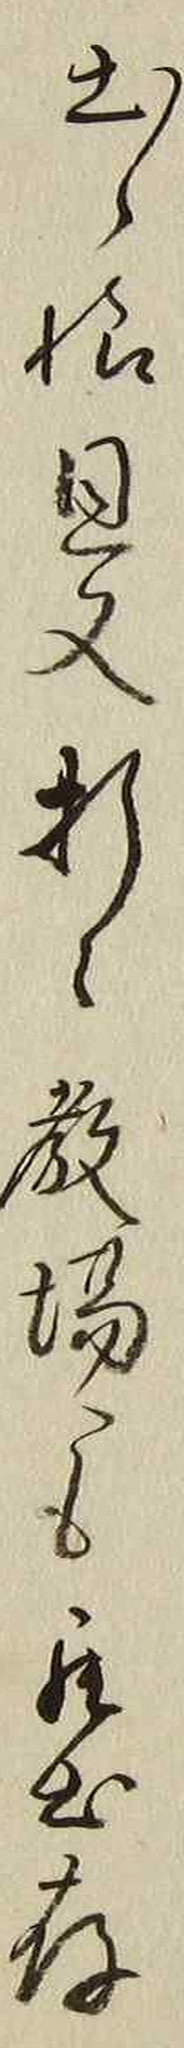出候様且又折々教場へも罷出存
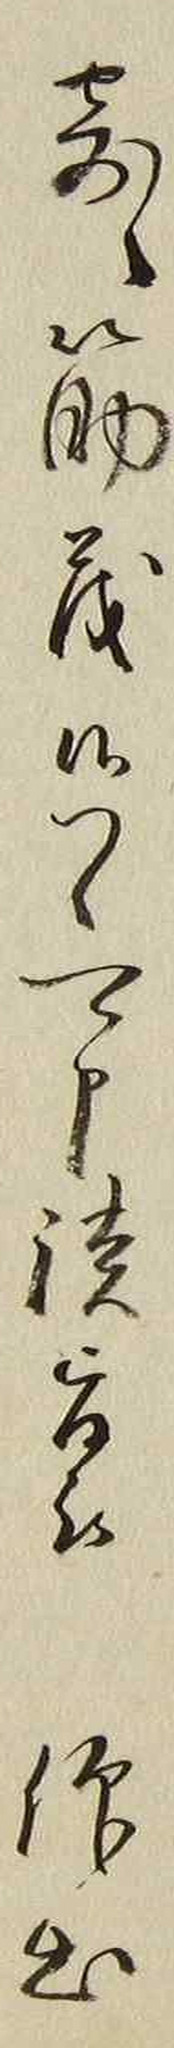寄候筋茂候ハヽ可申談被仰出
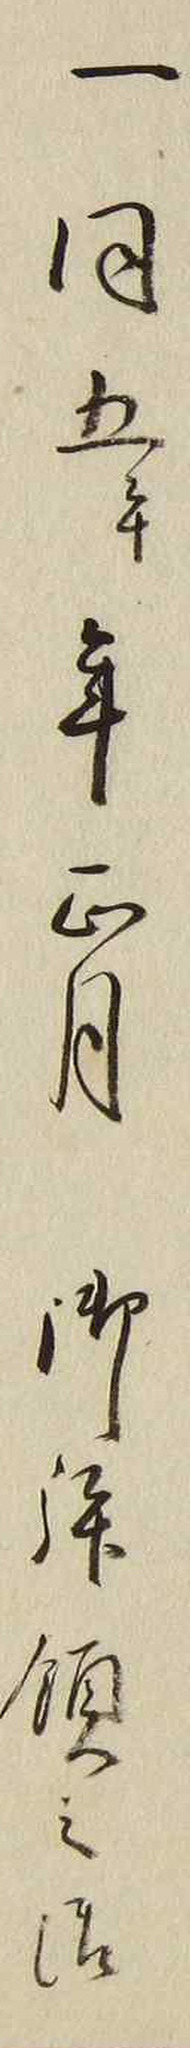一同五午年正月御拝領の御

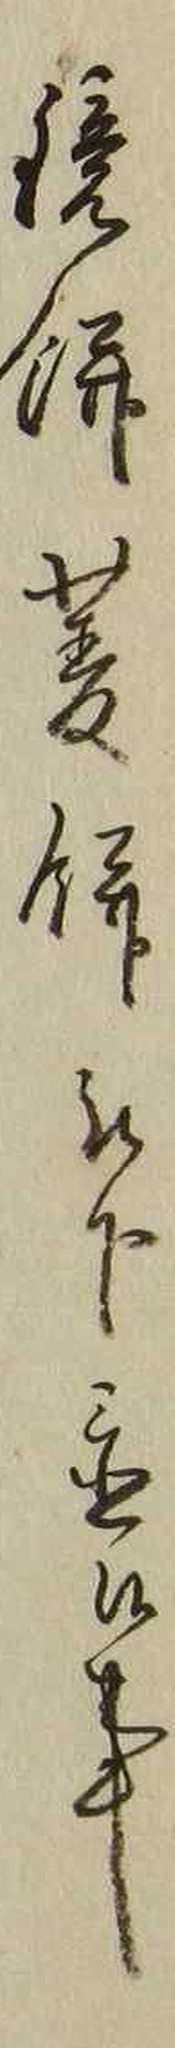鏡餅菱餅被下置候事
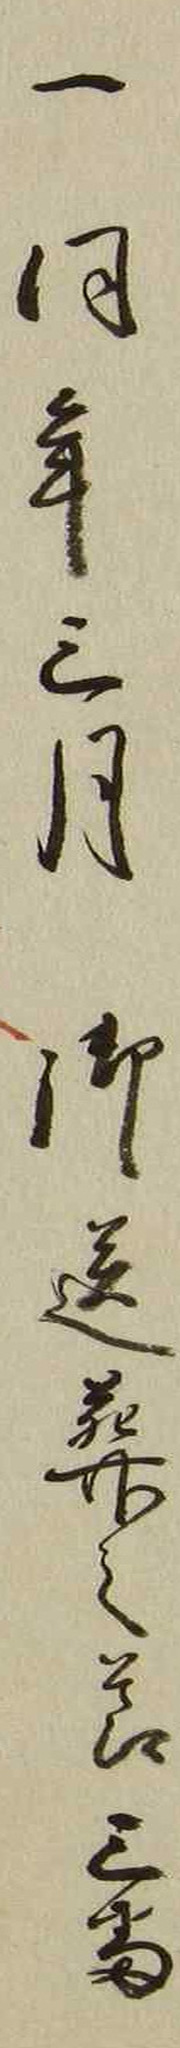一同年三月御送葬の節三番
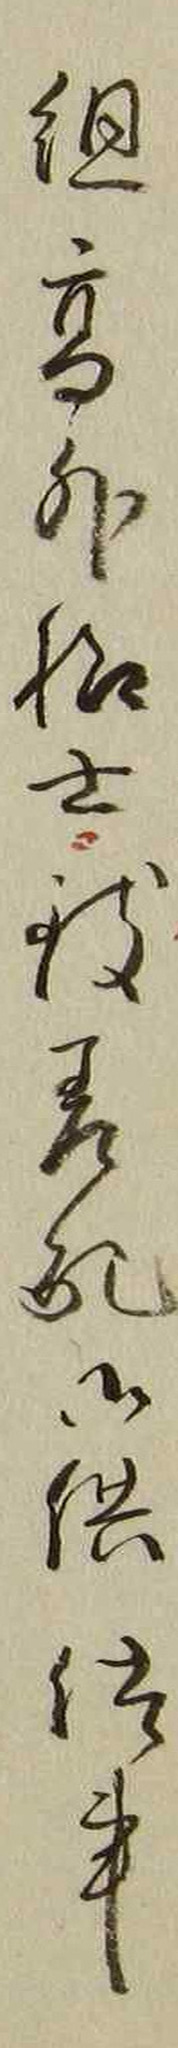組高外様士致差配御供仕候事
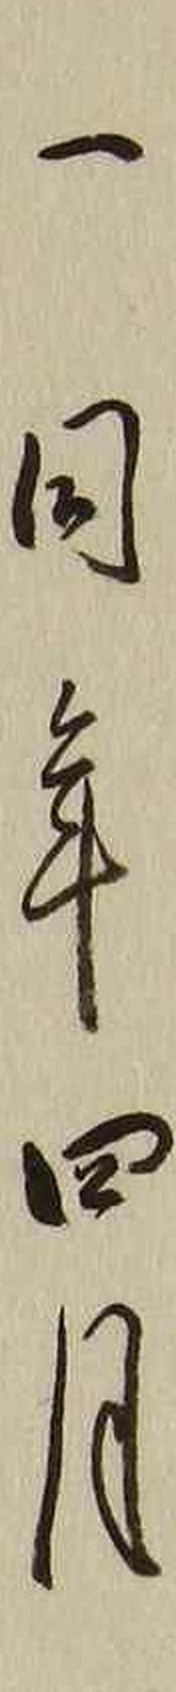一同年四月
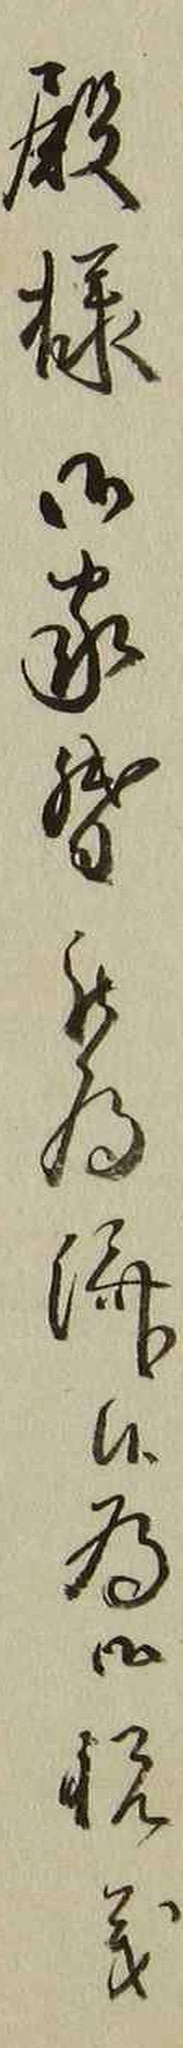殿様御家督被為済候為御祝義
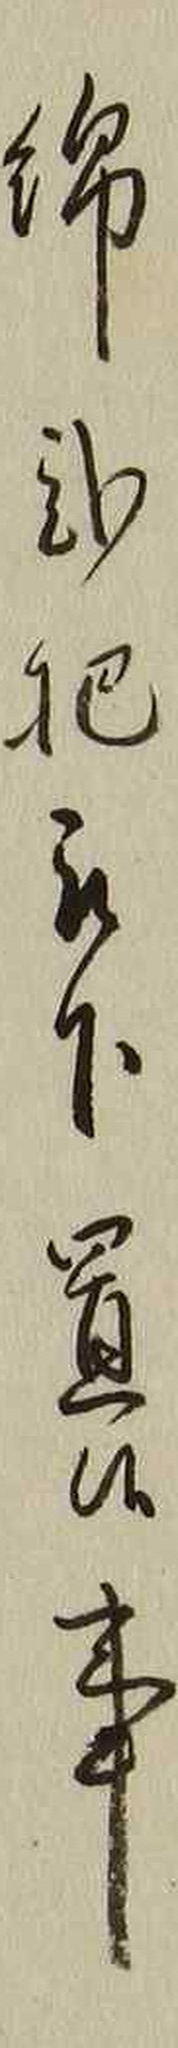綿弐把被下置候事
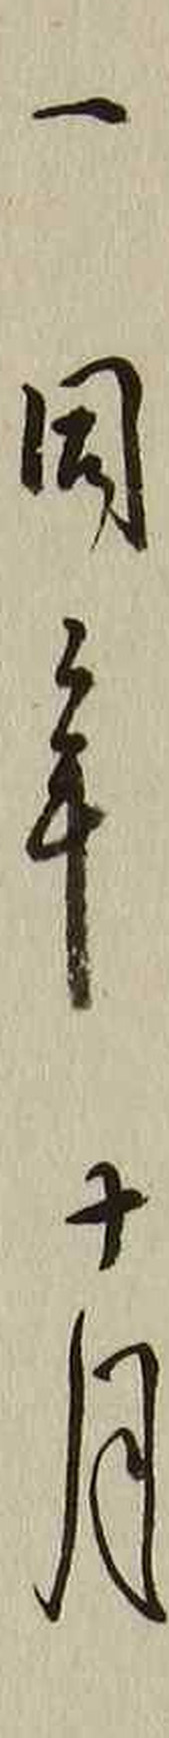一同年十月
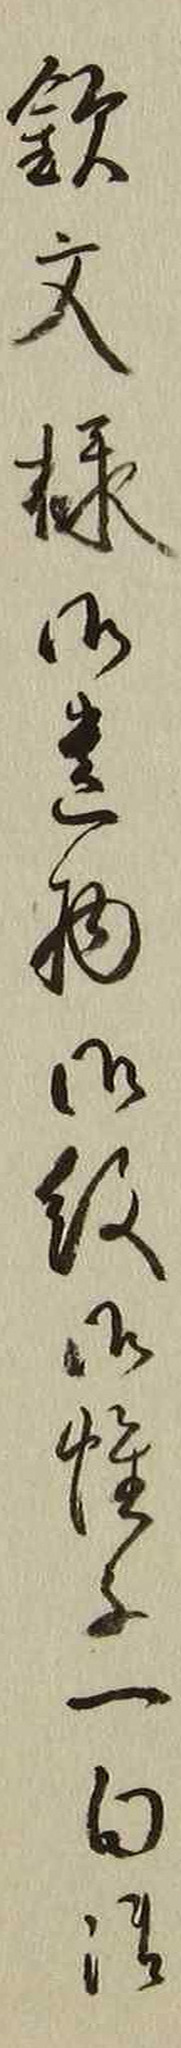欽文様御遺物御紋御帷子一白御
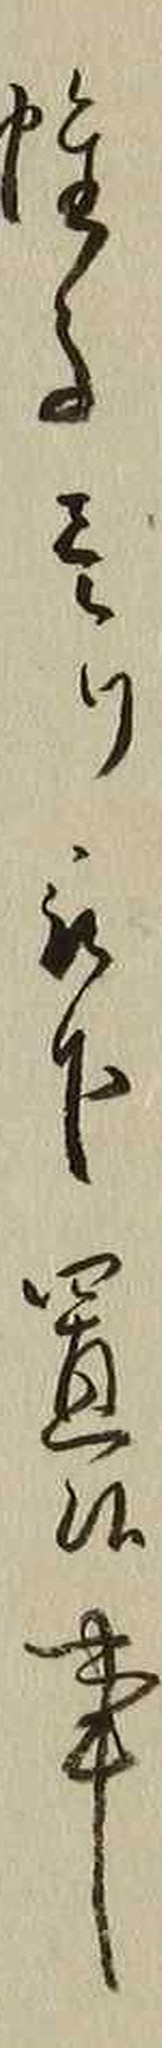帷子壱ツ被下置候事
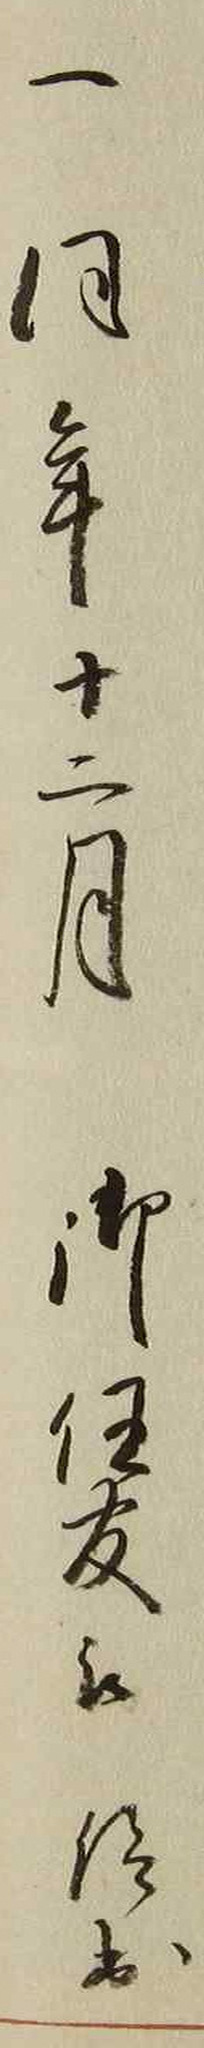一同年十二月御任官被仰出
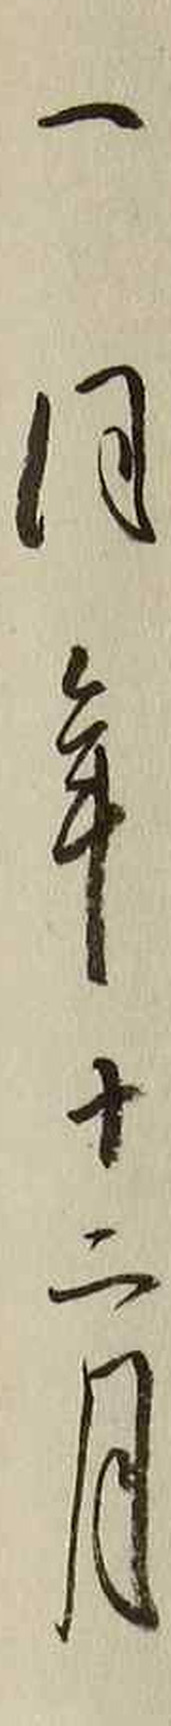一同年十月
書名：諸士系譜　巻之1　い之部1
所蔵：会津若松市立会津図書館
